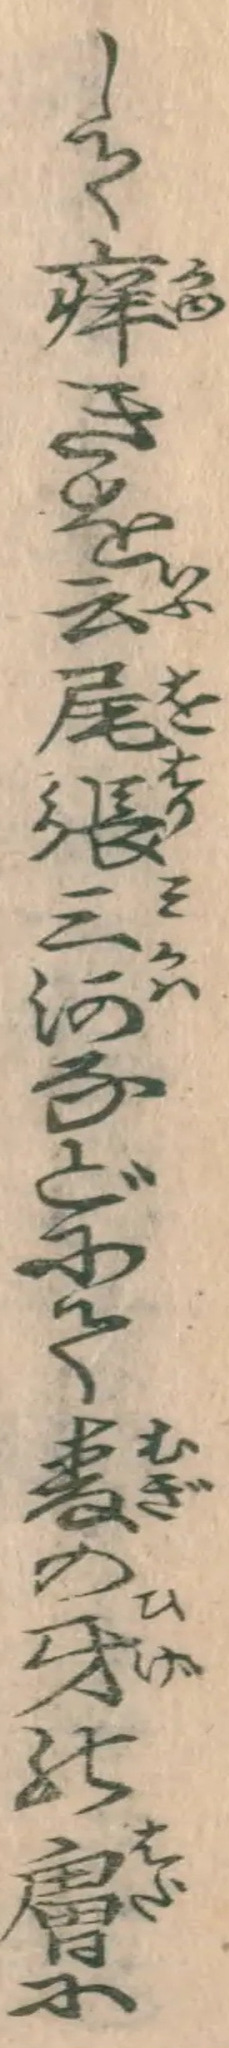して痒きを云尾張三河などにて麦の牙の膚に
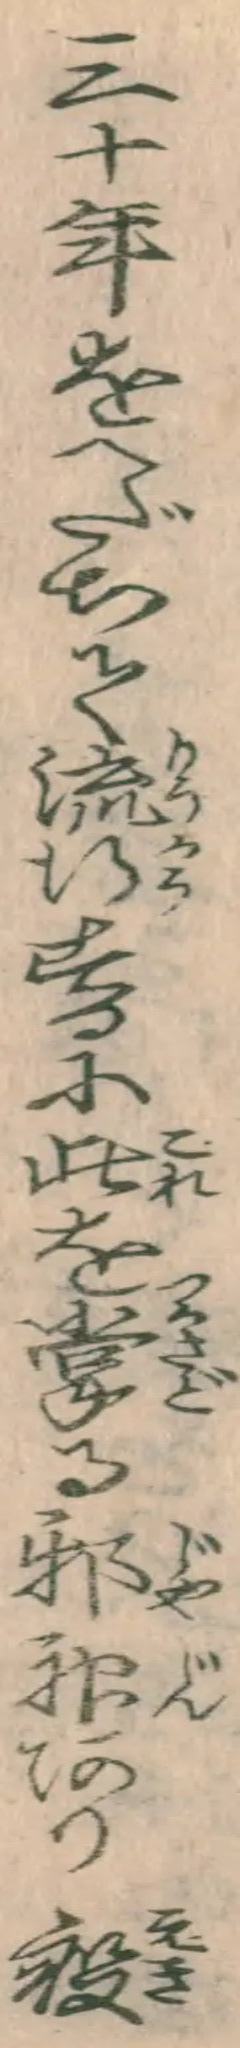三十年をへだちて流行するに此を掌る邪神あり疫
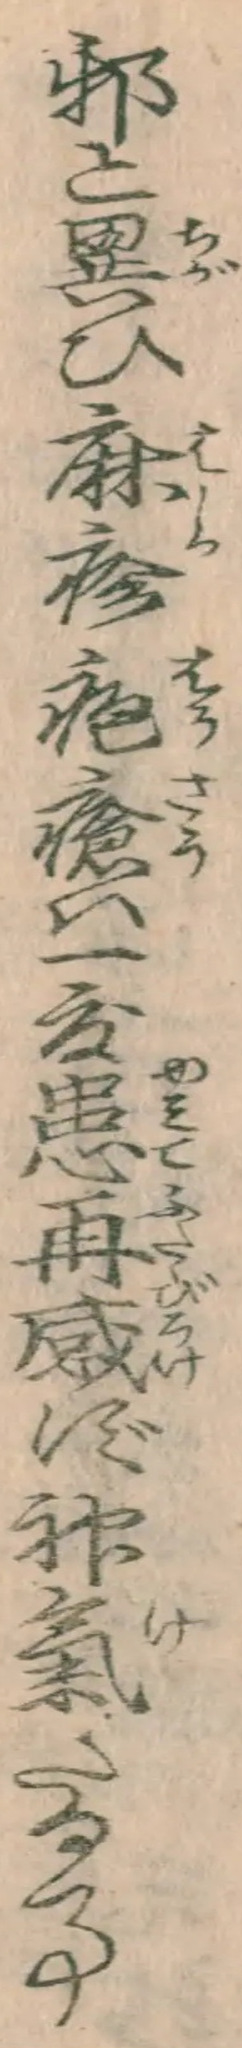邪と異ひ麻疹疱瘡は一度患再感ず神気たる事
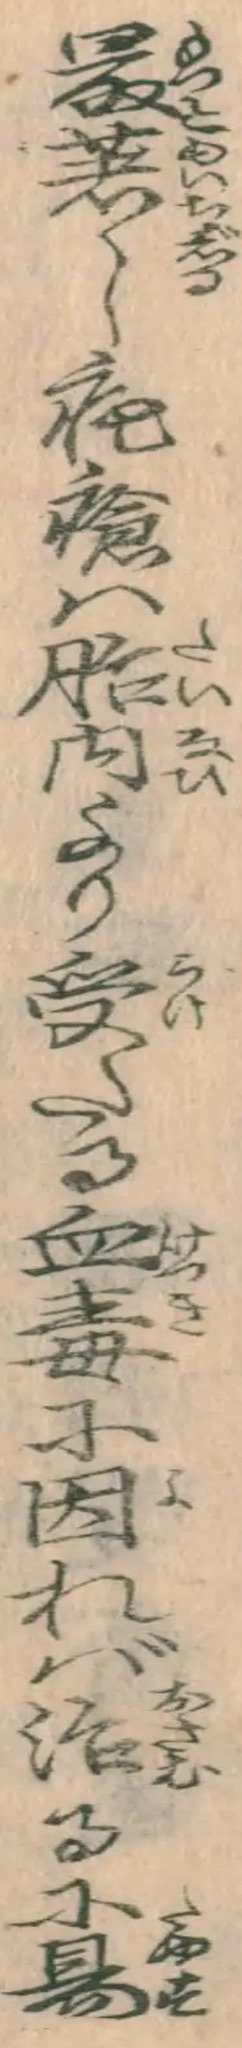最著し疱瘡は胎内より受たる血毒に因れば治るに易
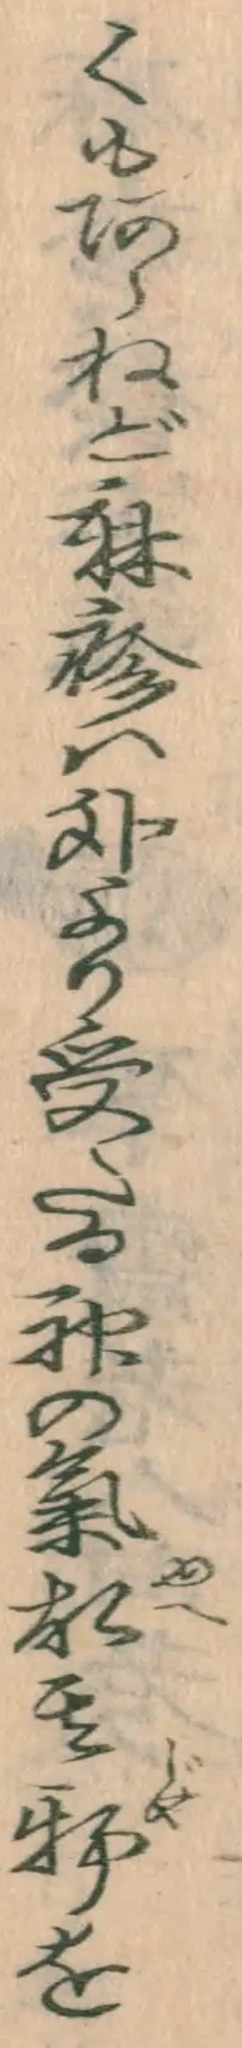くもあらねど麻疹は外より受たる神の気故其邪を
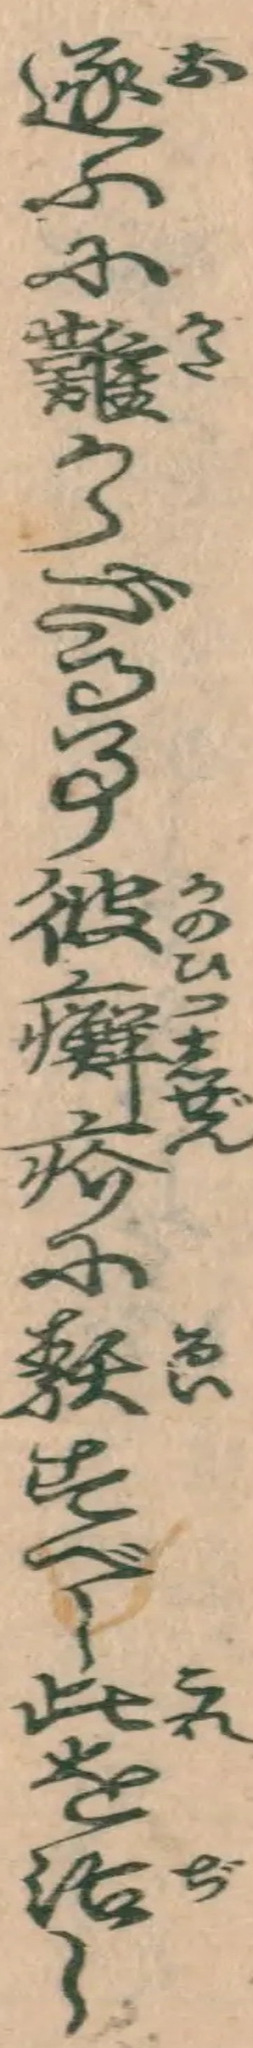逐ふに難からざる事彼癬疥に類すべし此を治し
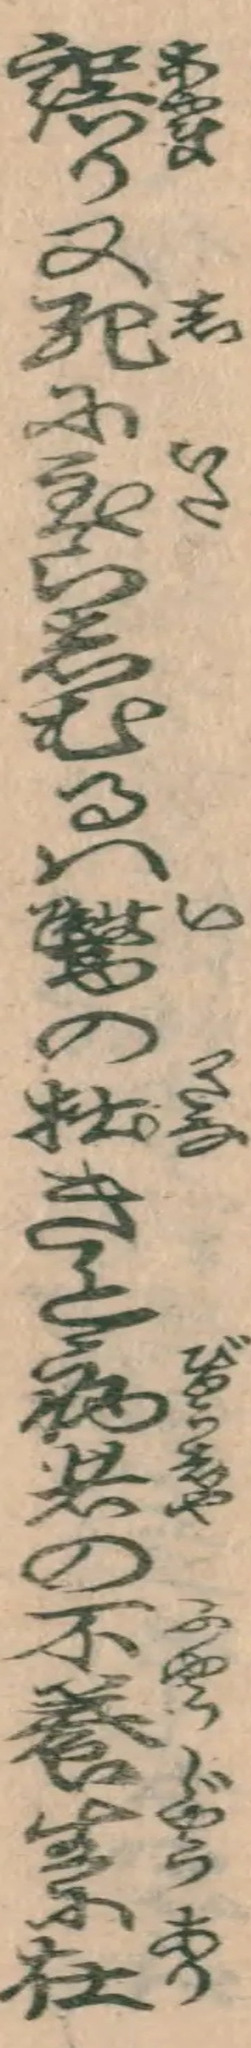誤り又死に至らしむるは医の拙きと病者の不養生に在
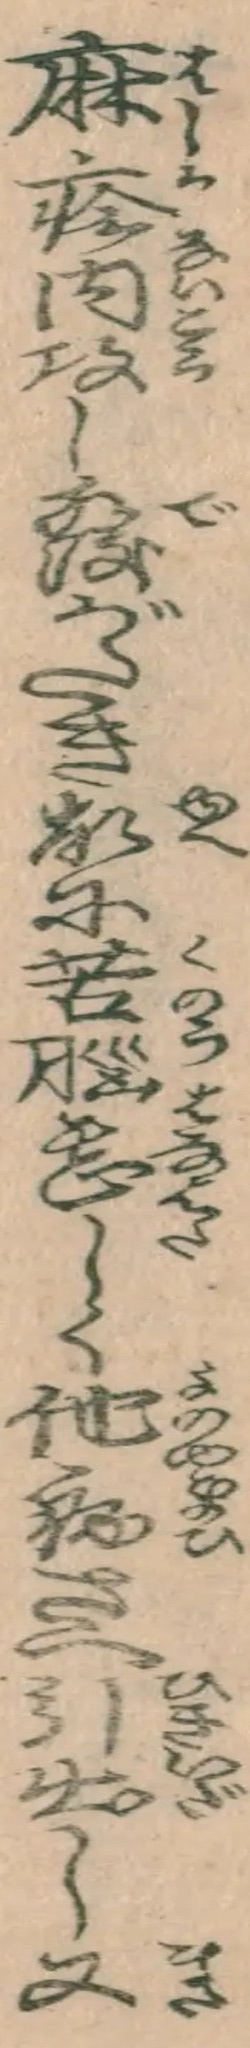麻疹内攻し発がたき故に苦脳甚しく他病さへ引出し又
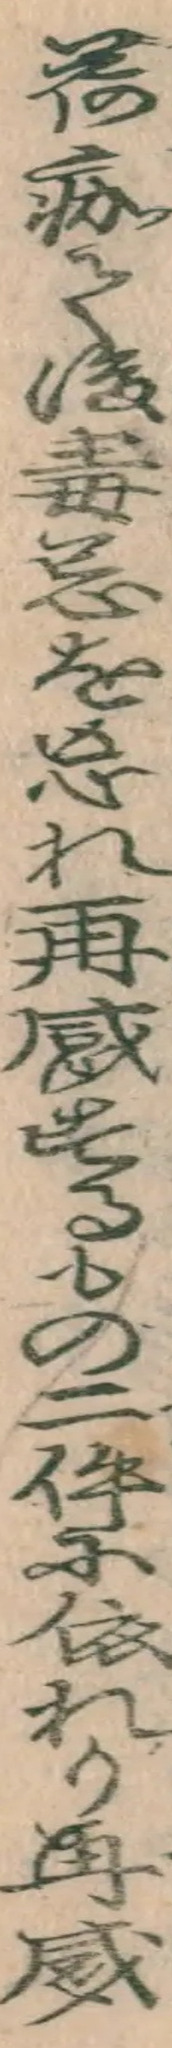荷痂て後毒忌を忘れ再感するもの二件に依れり再感
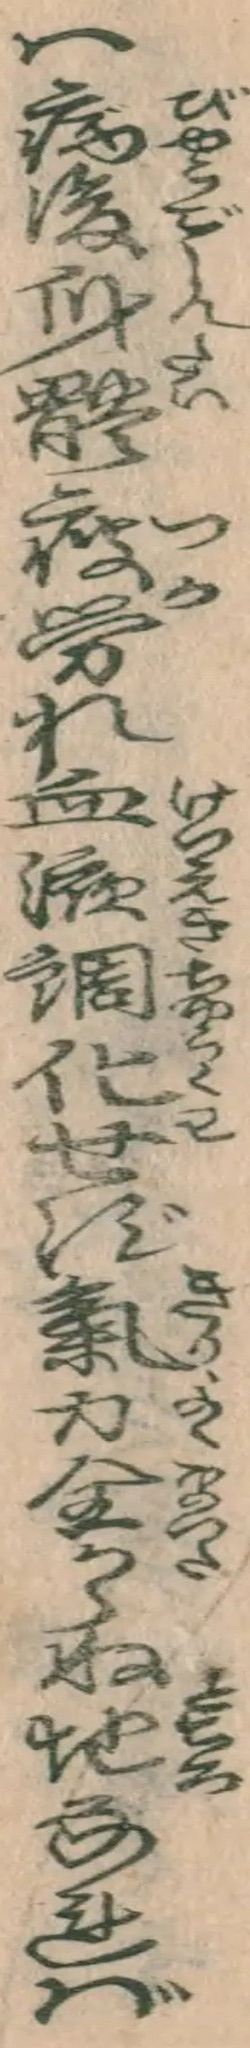は病後身体疲労れ血液調化せず気力全からぬ地なれば
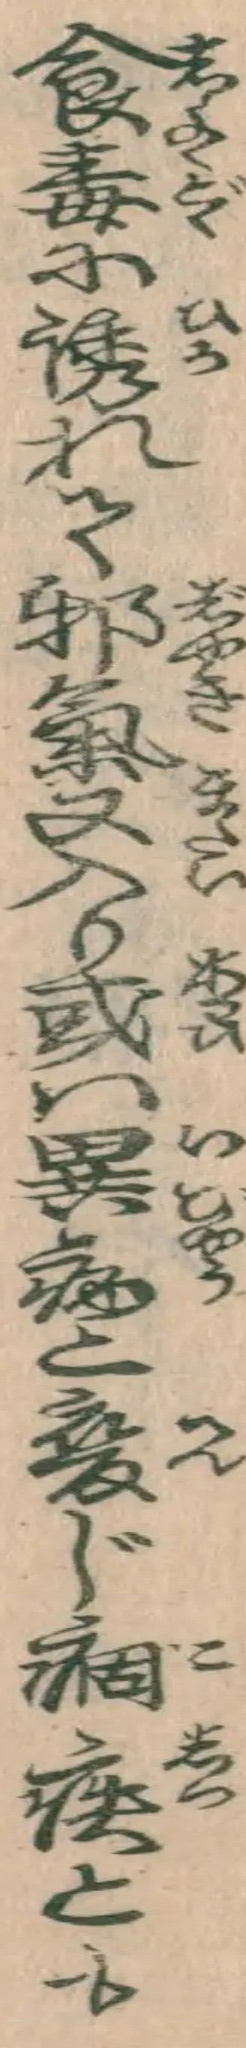食毒に誘れて邪気又入り或は異病と変じ痼疾とも
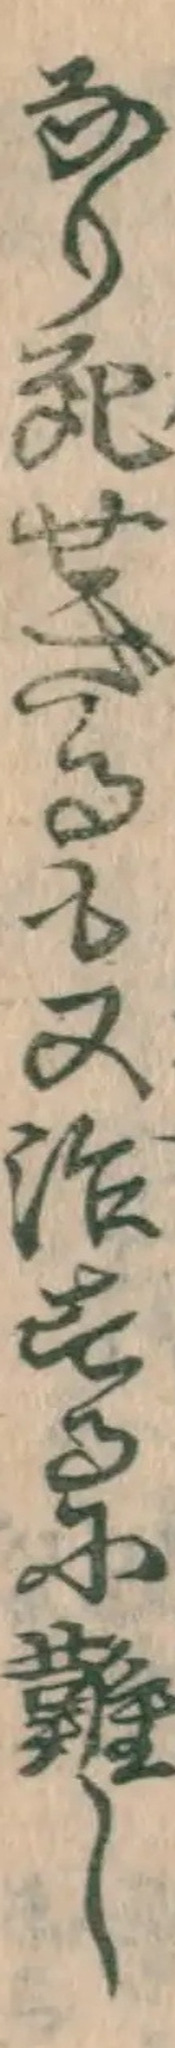なり死せざるも又治するに難し
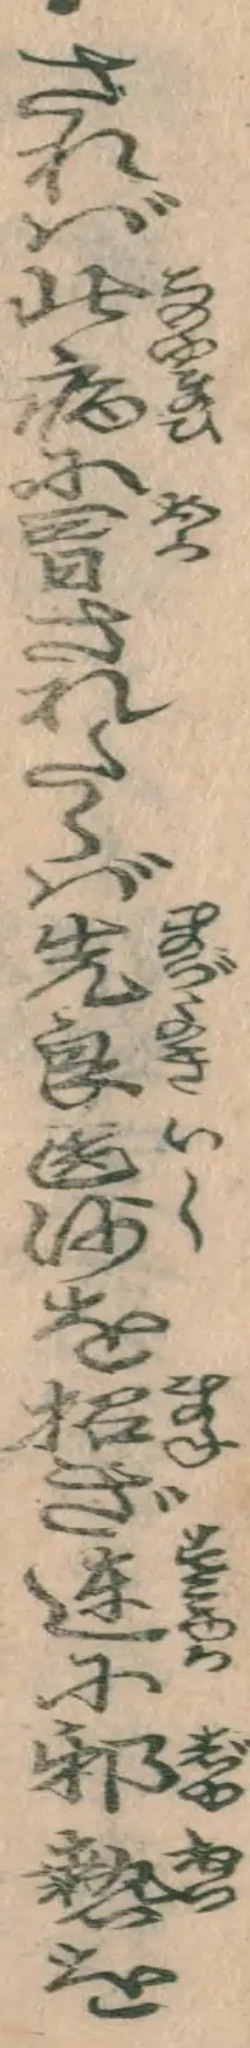・されば此病に冒されたらば先良医師を招ぎ速に邪熱を

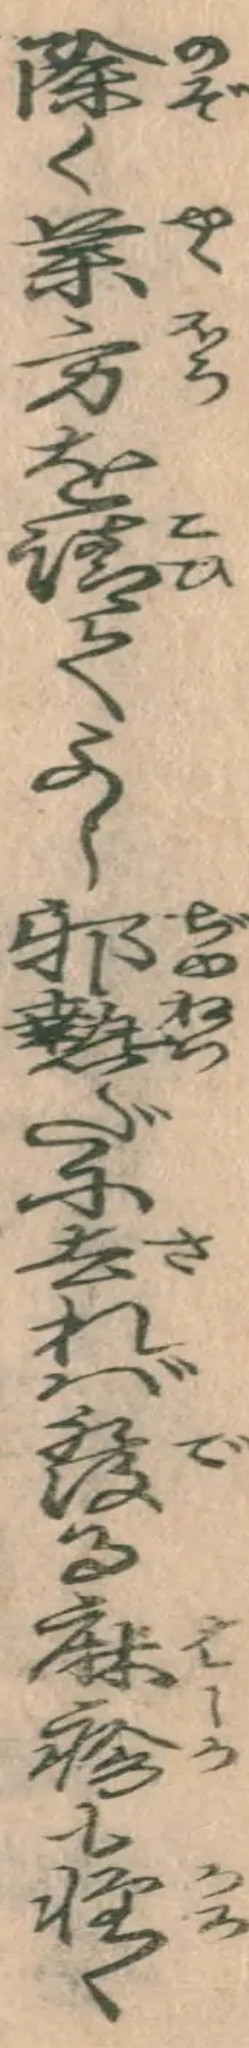除く薬方を請てよし邪熱だに去れば発る麻疹も軽く
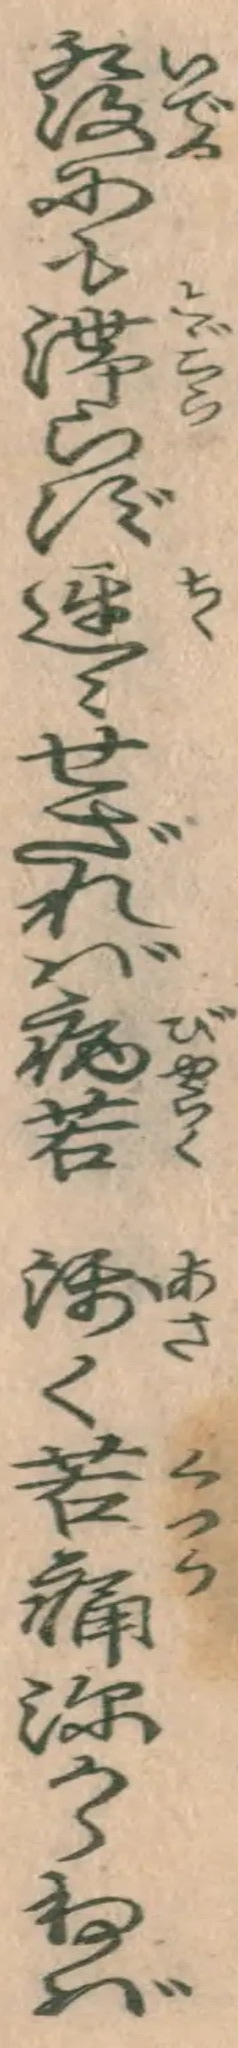発にも滞らず遅々せざれば病苦浅く苦痛深からねば
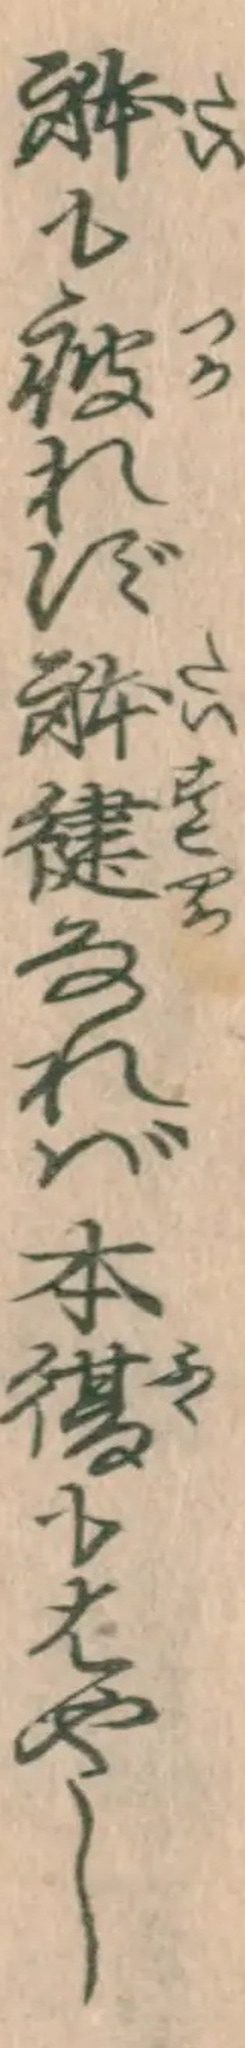体も疲れず体健なれば本復もはやし
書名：麻疹養生鑑
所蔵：国立国会図書館 National Diet Library, JAPAN
